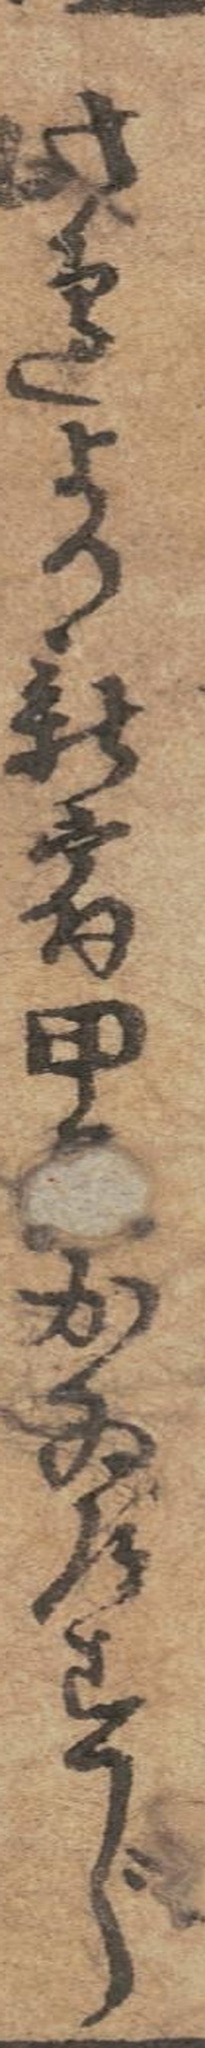此辺より新宿甲州かゐ道すじ
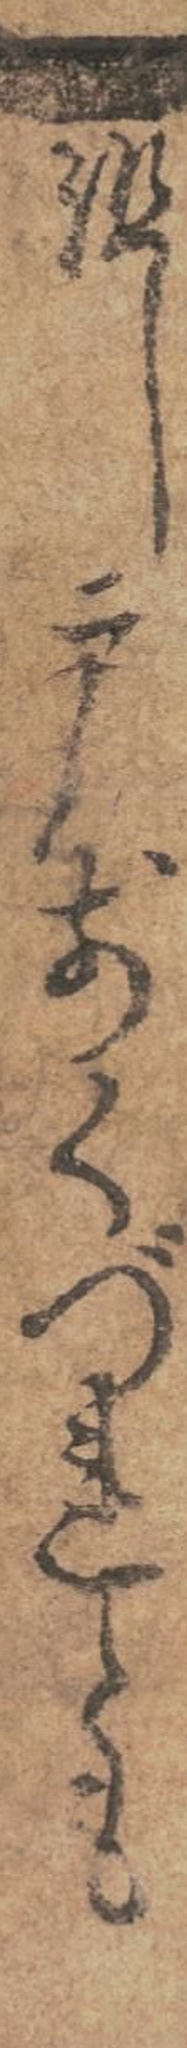但し戸前くづれとも
